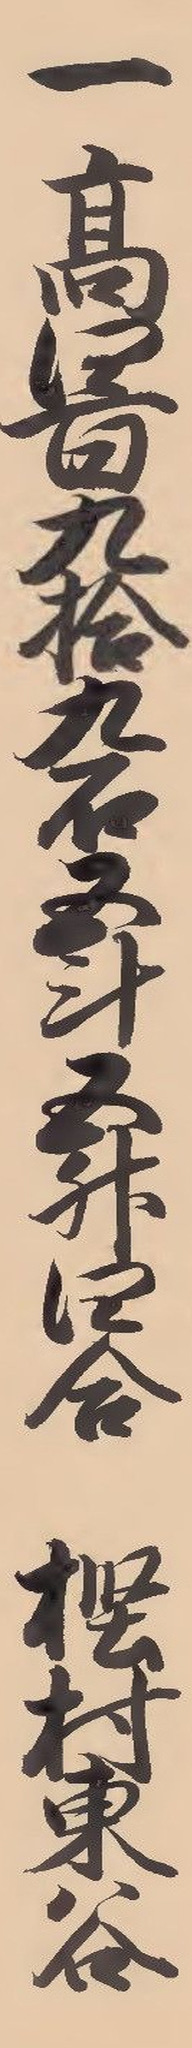一高四百九拾九石五斗五升四合樫村東谷
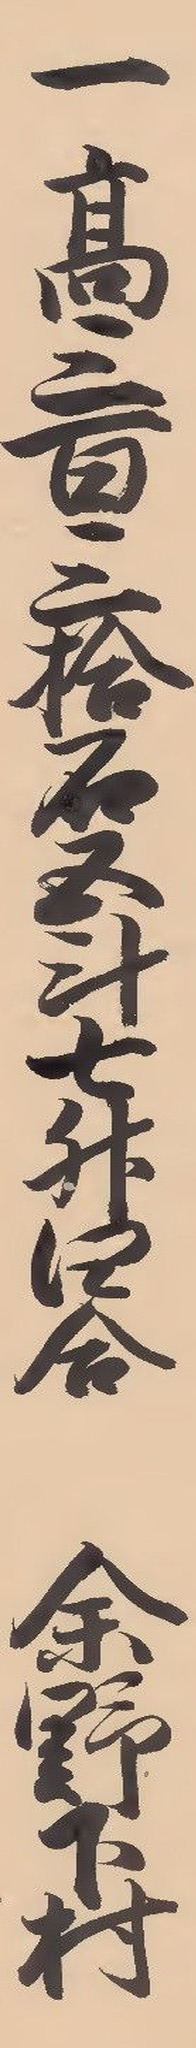一高三百三拾石五斗七升四合余野下村

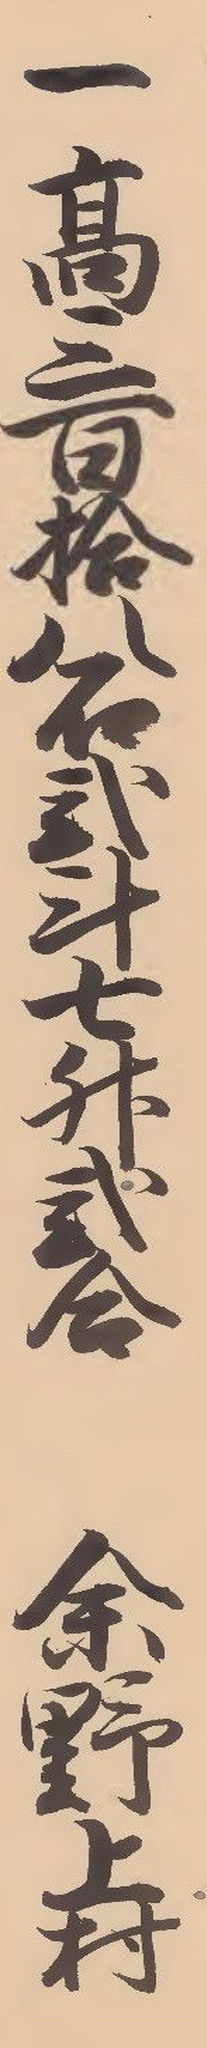一高三百拾八石弐斗七升弐合余野上村
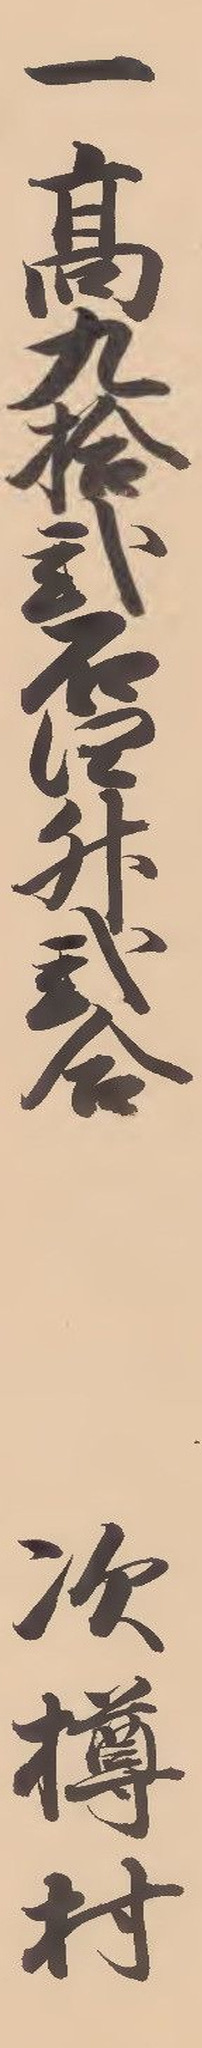一高九拾弐石四升弐合次樽村
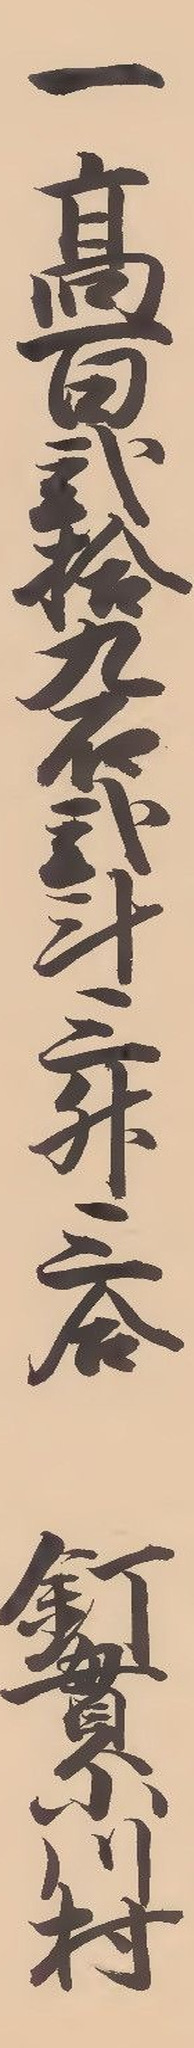一高百弐拾九石弐斗三升三合釘貫小川村
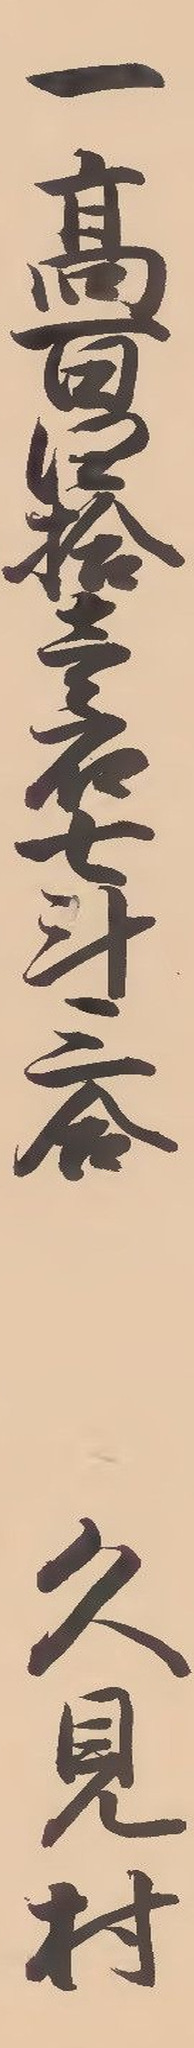一高百四拾壱石七斗三合久見村
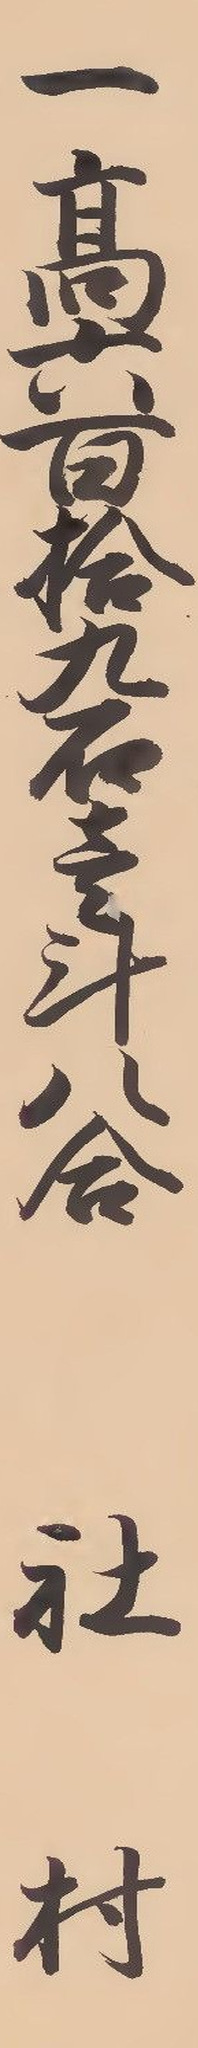一高六百拾九石壱斗八合社村
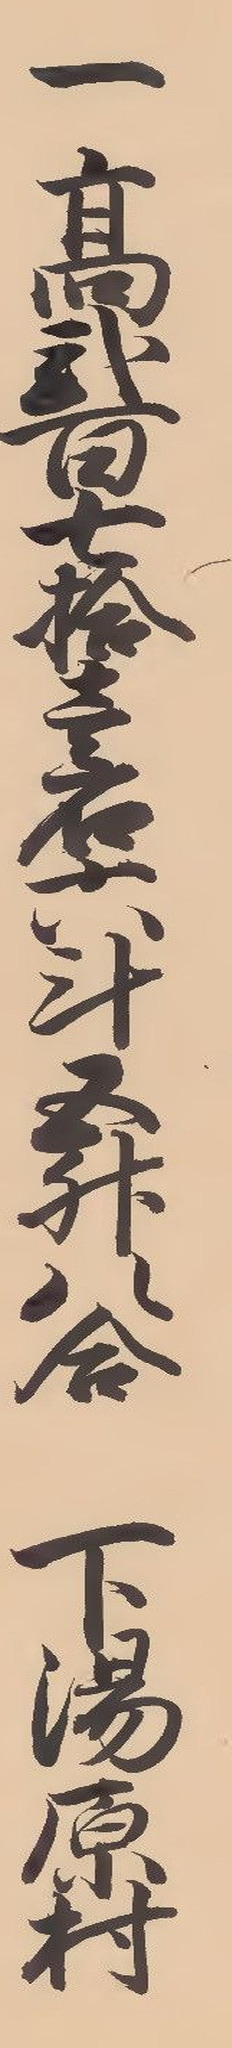一高弐百七拾壱石六斗五升八合下湯原村
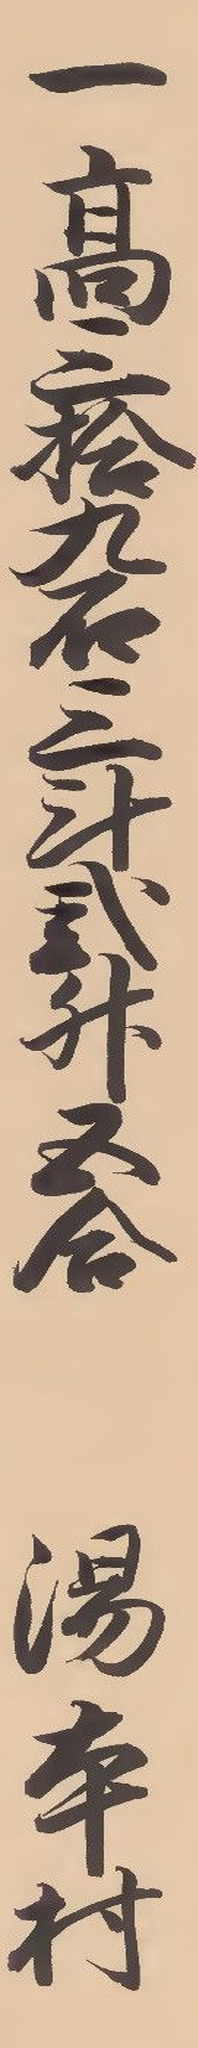一高三拾九石三斗弐升五合湯本村
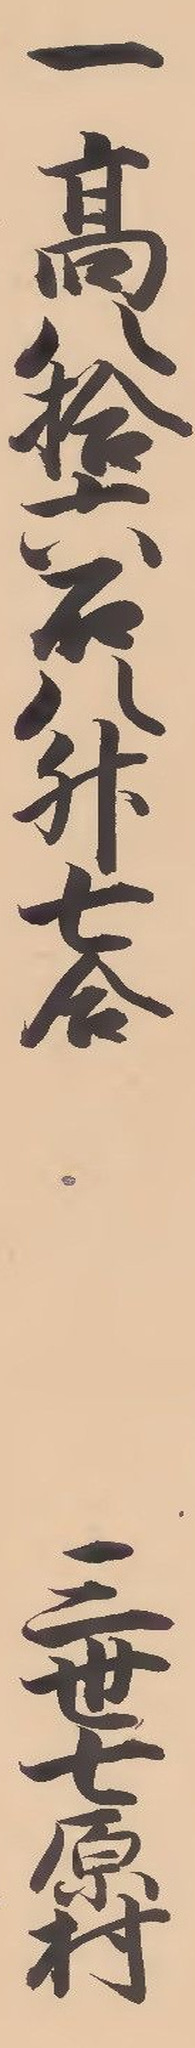一高八拾六石八升七合三世七原村

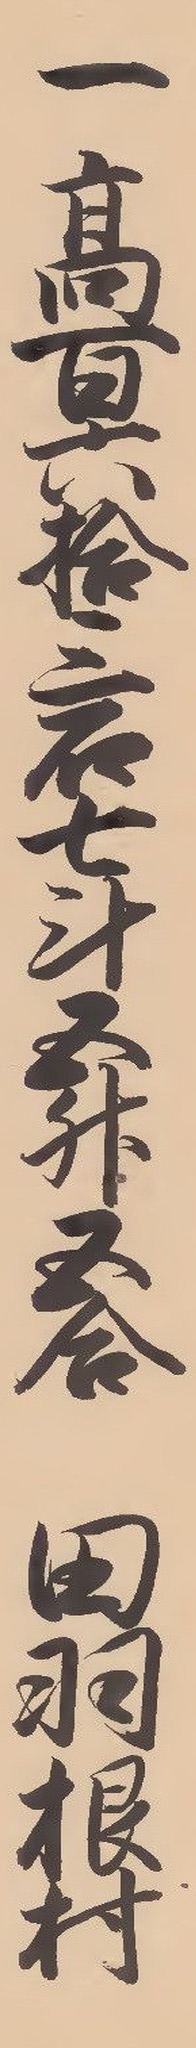一高百六拾三石七斗五升五合田羽根村
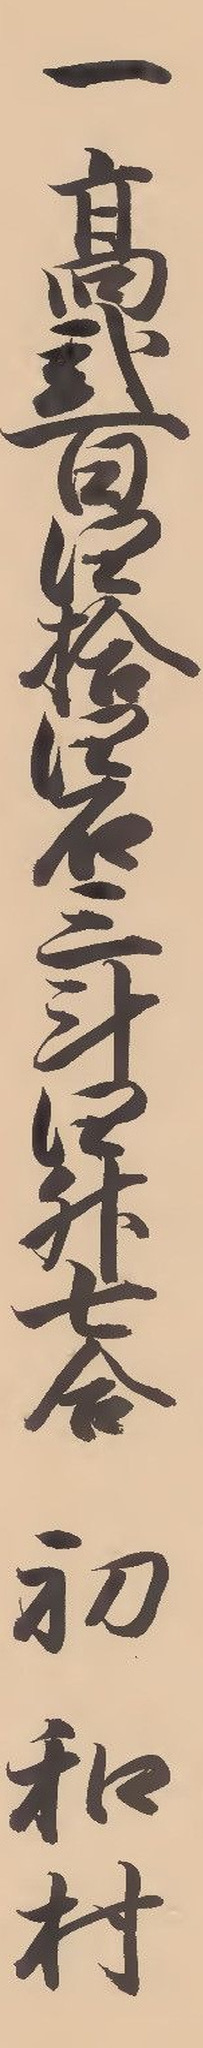一高弐百四拾四石三斗四升七合初和村
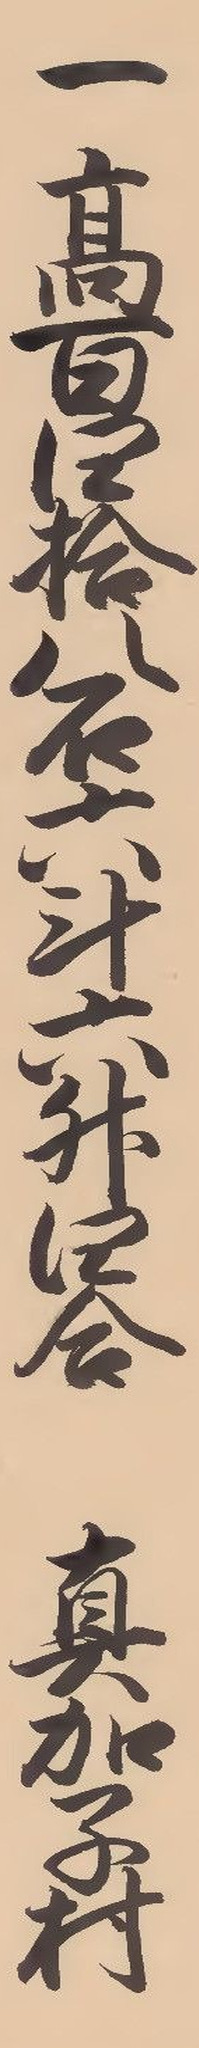一高百四拾八石六斗六升四合真加子村
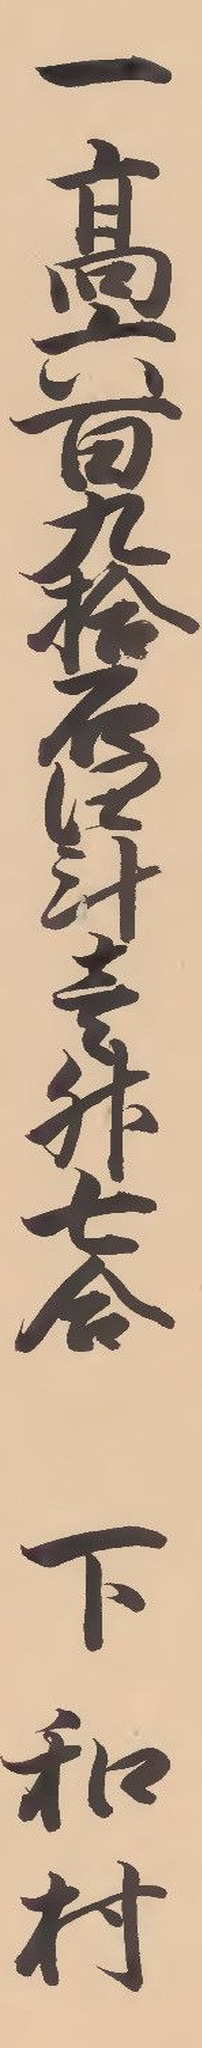一高六百九拾石四斗壱升七合下和村
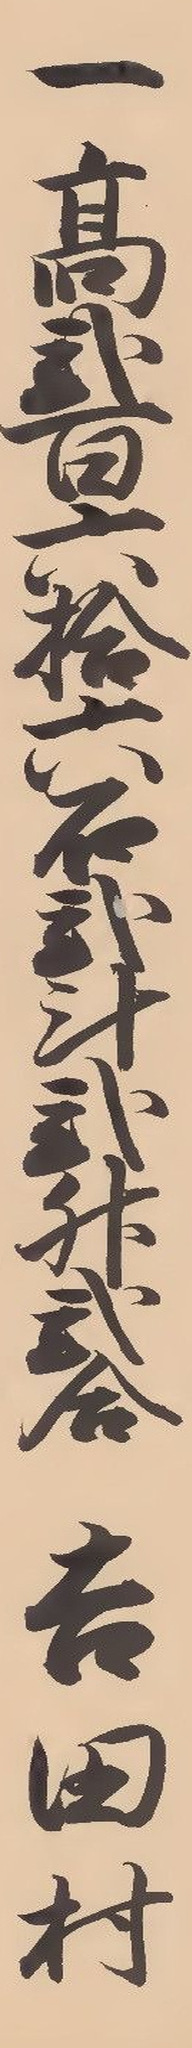一高弐百六拾六石弐斗弐升弐合吉田村
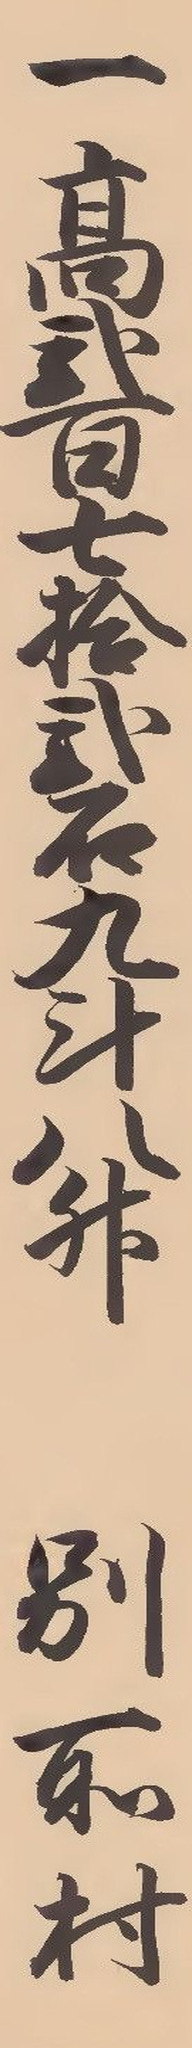一高弐百七拾弐石九斗八升別所村
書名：美作国郷帳
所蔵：国立公文書館 National Archives of Japan
